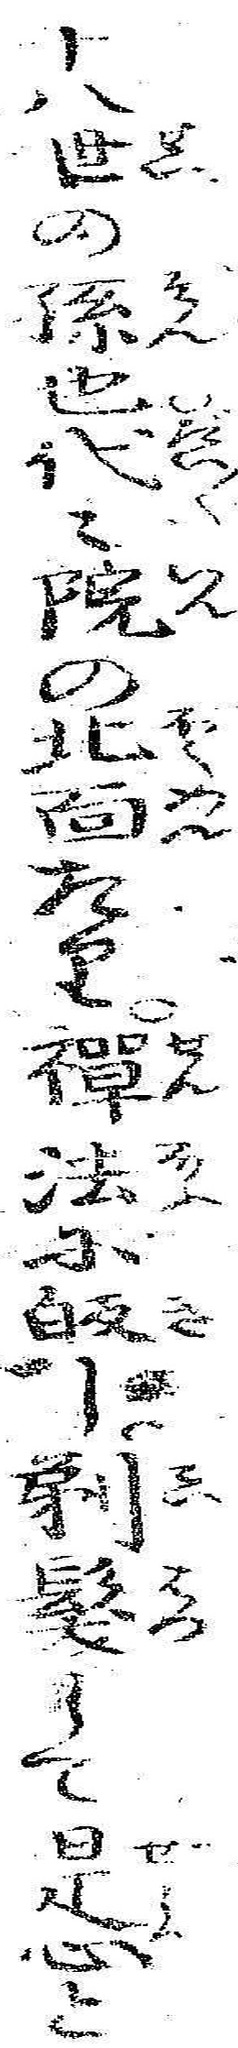十八世の孫也。代々院の北面たり。禅法に帰し。剃髪して是心と
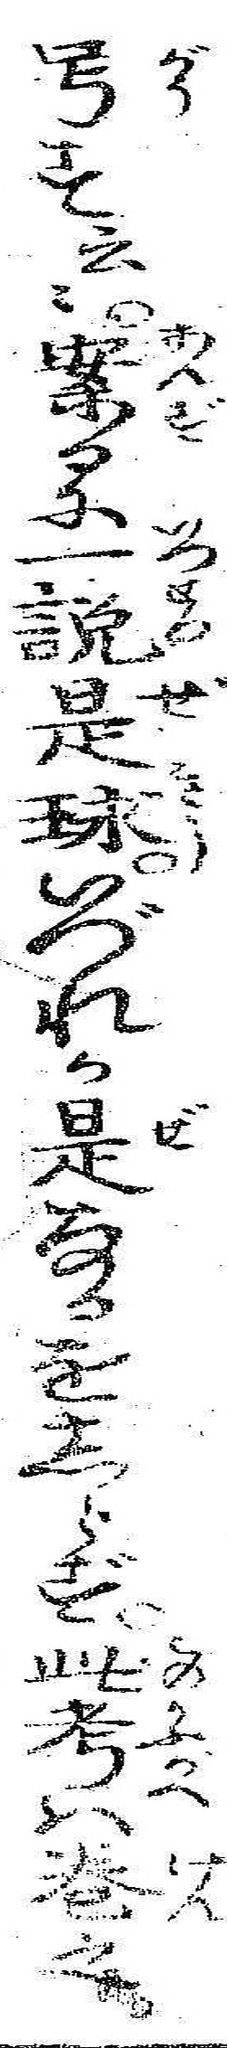号す云々。案るに一説是球。いづれか是なるをしらず。此考は巻之
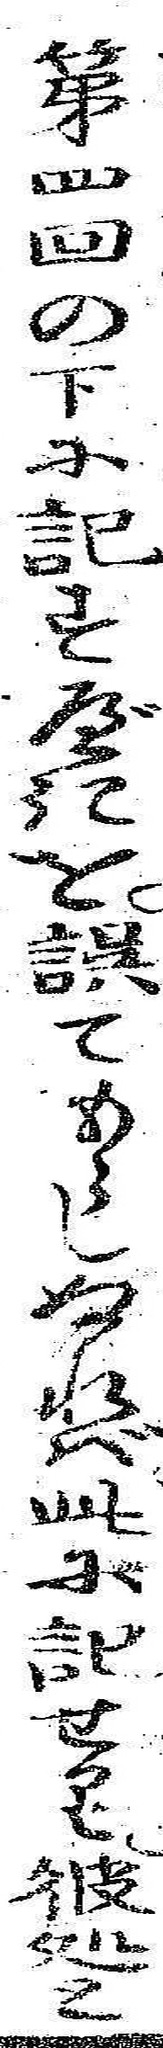第四回の下に記すべきを。誤てもらしぬれば。此に記せり。彼処と
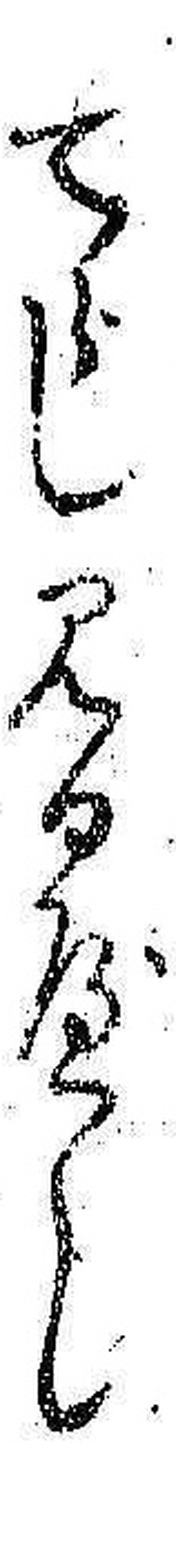てらし見るべし
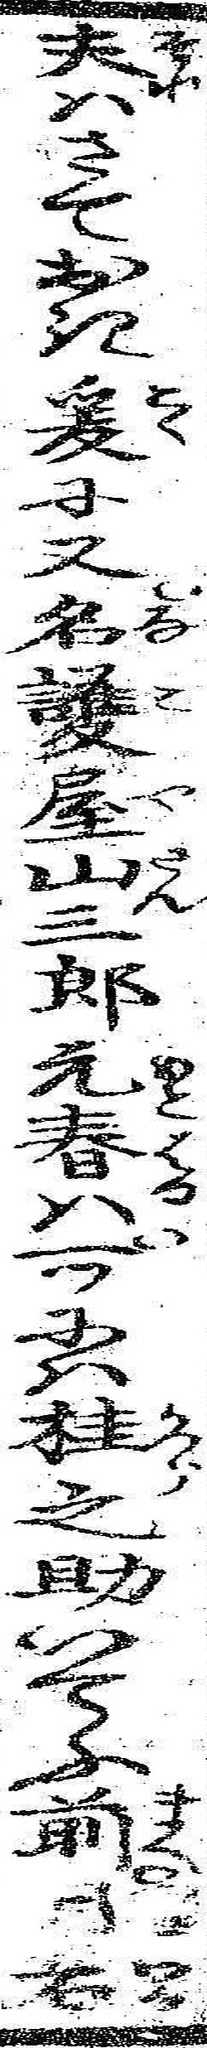夫はさておき爰に又。名護屋山三郎元春は。一ツには桂之助いてふ前。月若
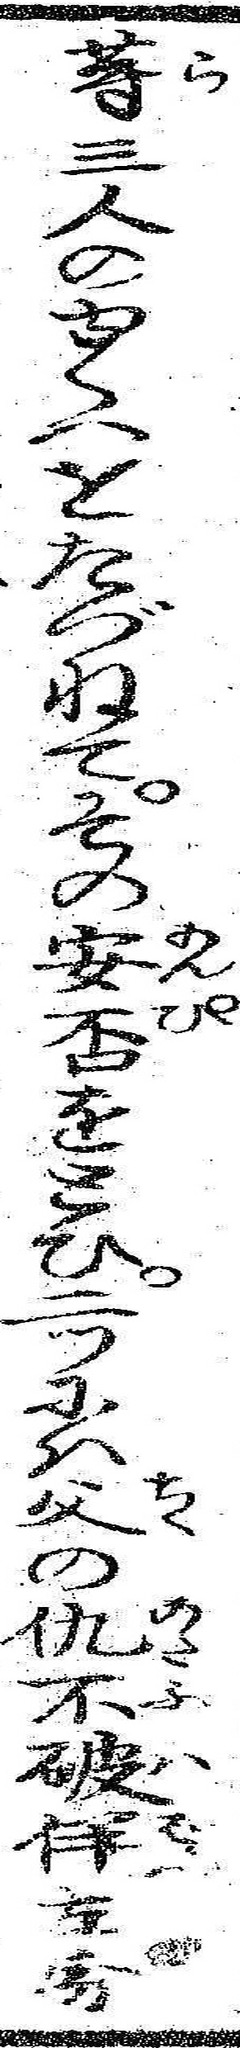等三人のゆくへをたづねて。その安否をとひ。二ツには父の仇不破伴左衛
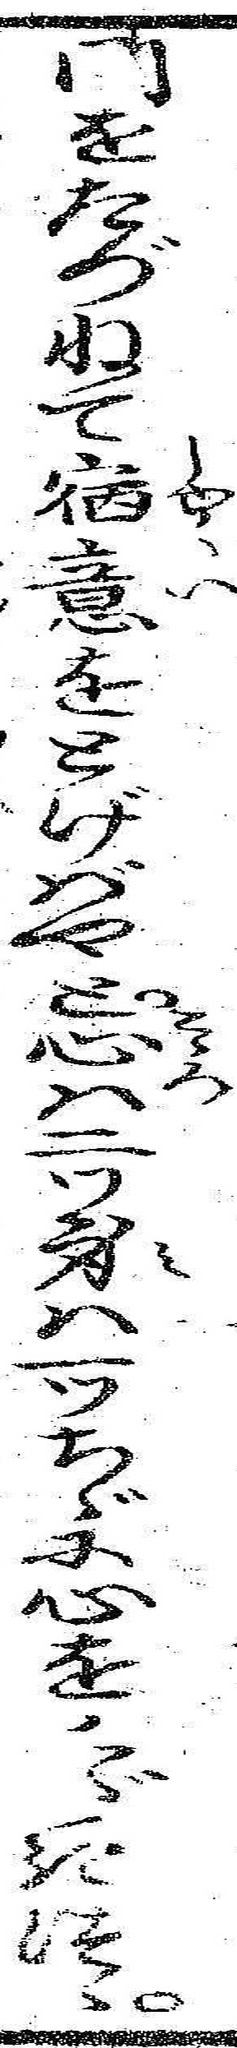門をたづねて宿意をとげばやと。心は二ツ身は一ツちゞに心をくだきつゝ。
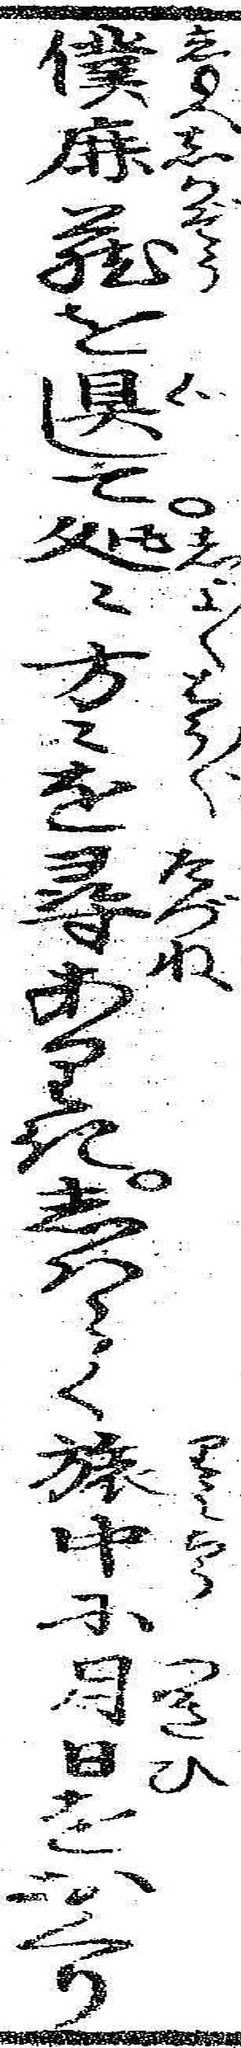僕鹿蔵を具して。処々方々を尋ありき。しはらく旅中に月日をおくり
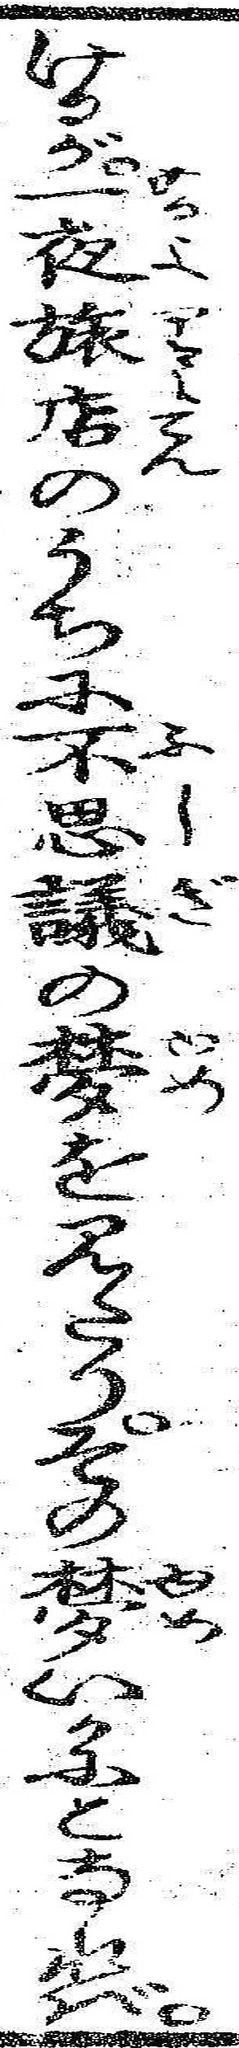けるが。一夜旅店のうちに不思議の夢を見たり。その夢いかにとなれば。
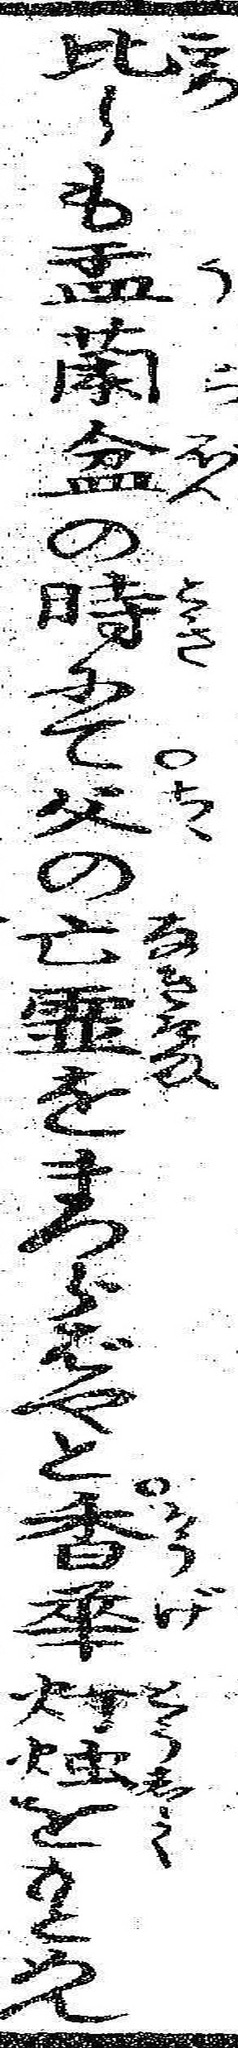比しも孟蘭盆の時にて。父の亡霊をまつらばやと。香華灯烛をもとめん
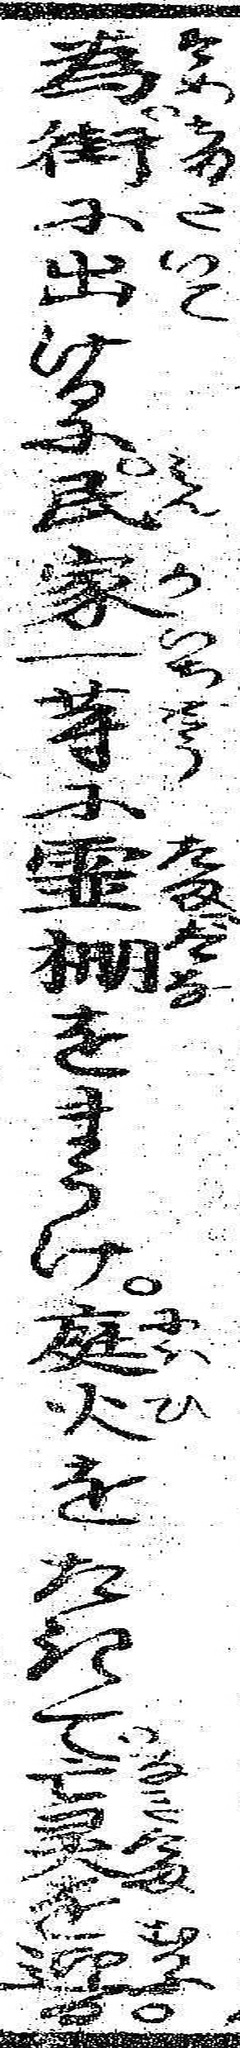為。街に出けるに。民家一等に霊棚をまうけ。庭火をたきて。亡霊を迎る。
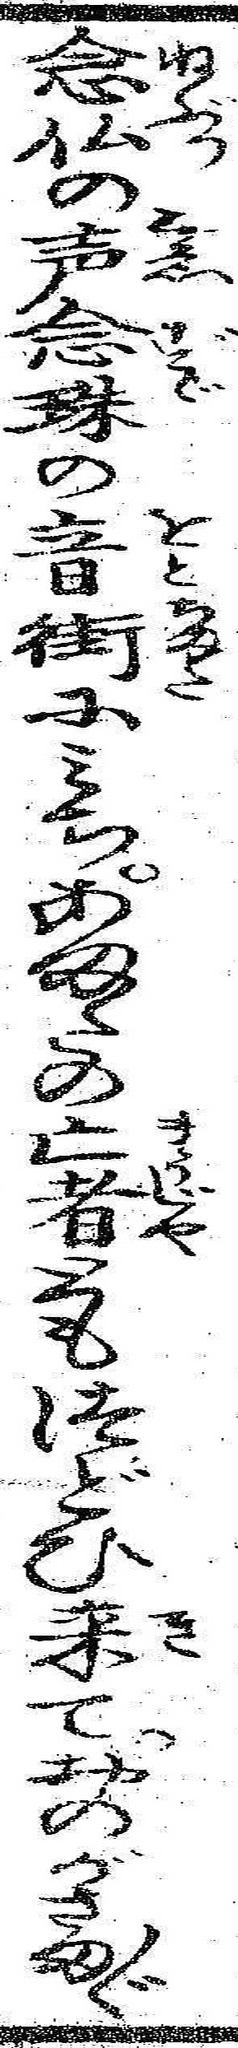念仏の声念珠の音街にみち。あまたの亡者ともつどひ来て。おのがさま〴〵
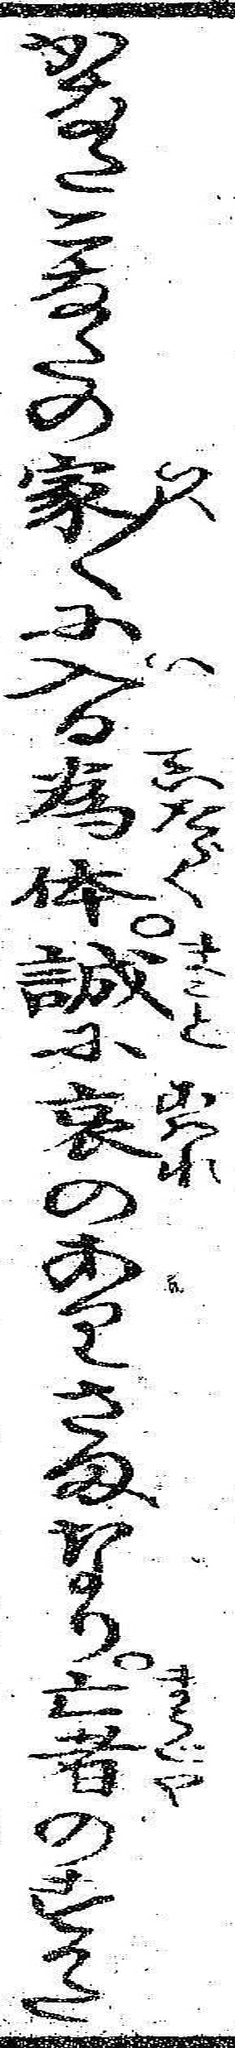かなたこなたの家に入る為体。誠に哀のありさまなり。亡者のすかた
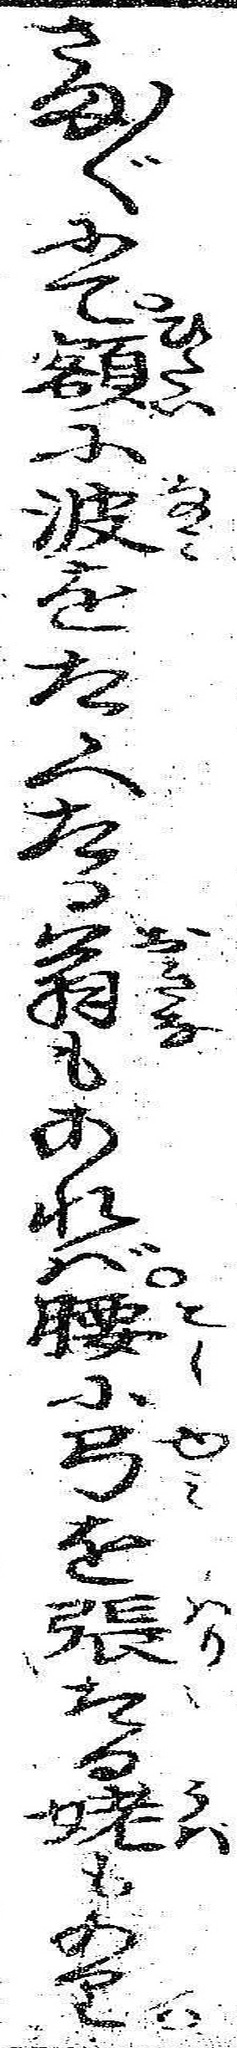さま〴〵にて。額に波をたゝへたる翁もあれば。腰に弓を張たる姥もあり。
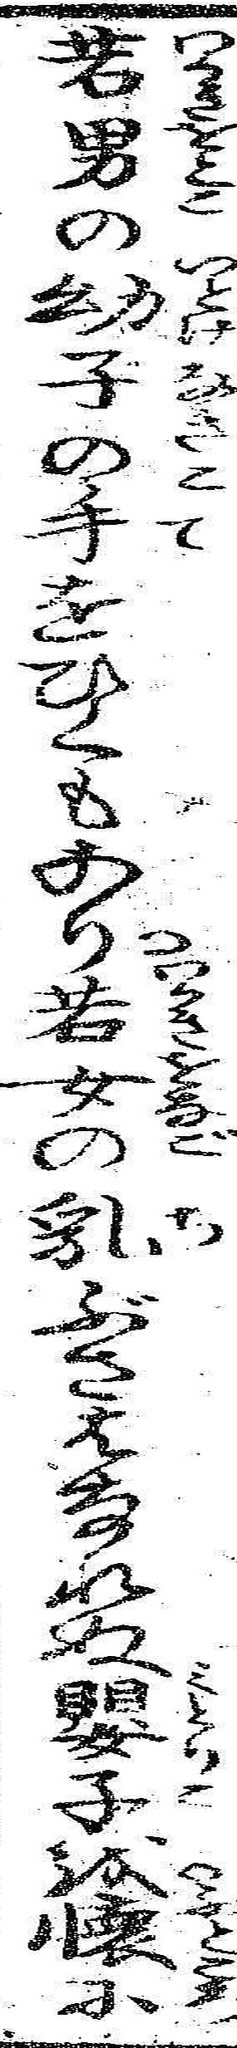若男の幼子の手をひくもあり。若女の乳ぶさはなれぬ嬰子を。懐に

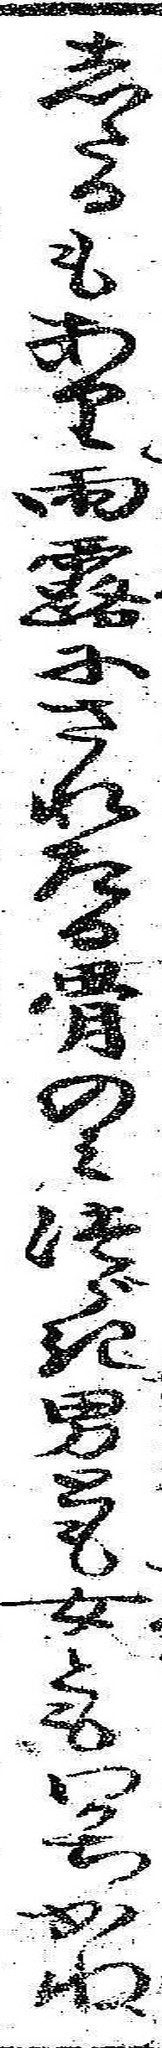したるもあり。雨露にされたる骨のみつゞき。男とも女ともわかちかね
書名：昔話稲妻表紙
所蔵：国文学研究資料館
